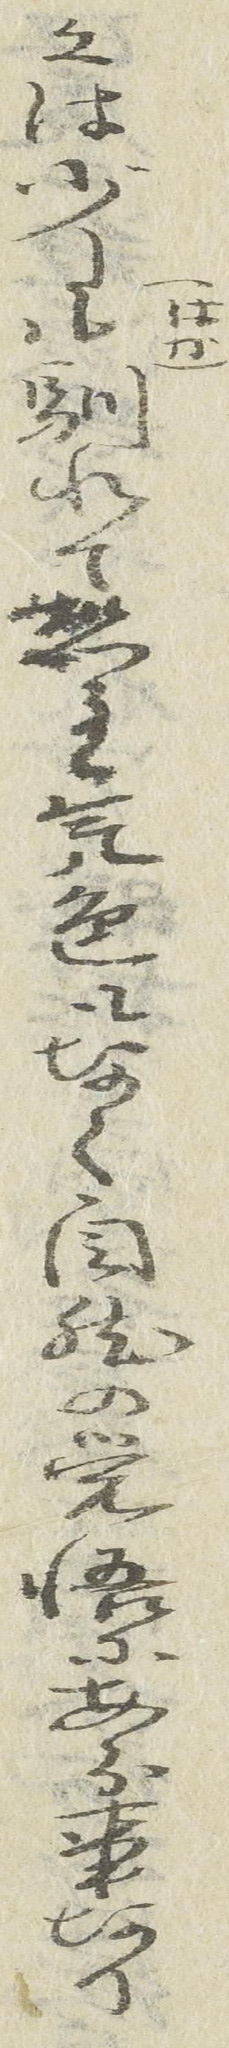々は少しも馴れて恐るゝ気色もなく自然の覚悟にあら事なり
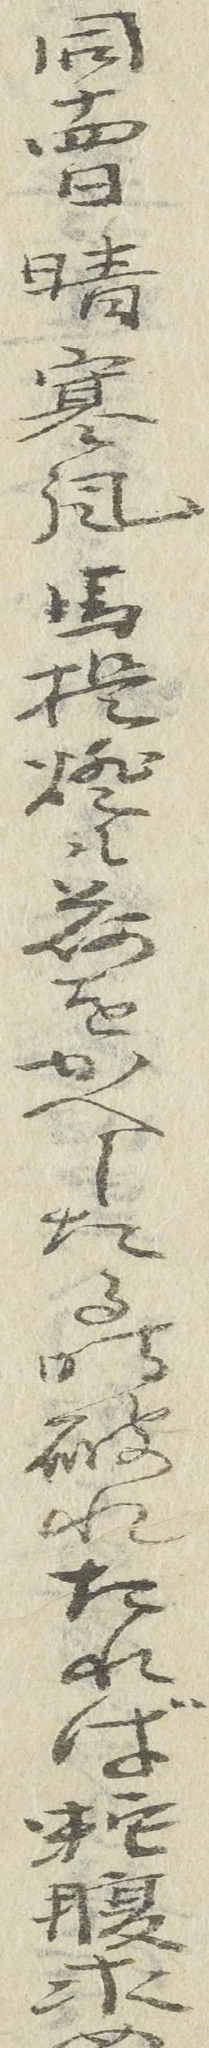一同十四日晴寒風馬提燈も荷をかへしたる時破れたれば蛇腹求め
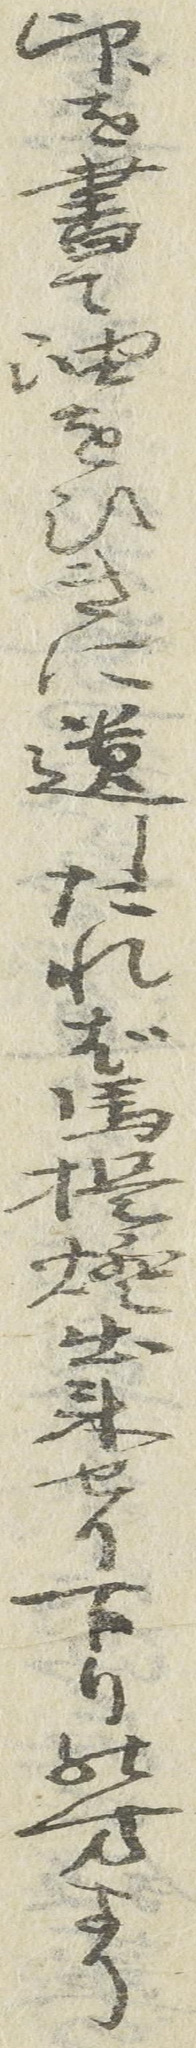印を書て油をひきに遺したれば馬提燈出来せり下りの方より

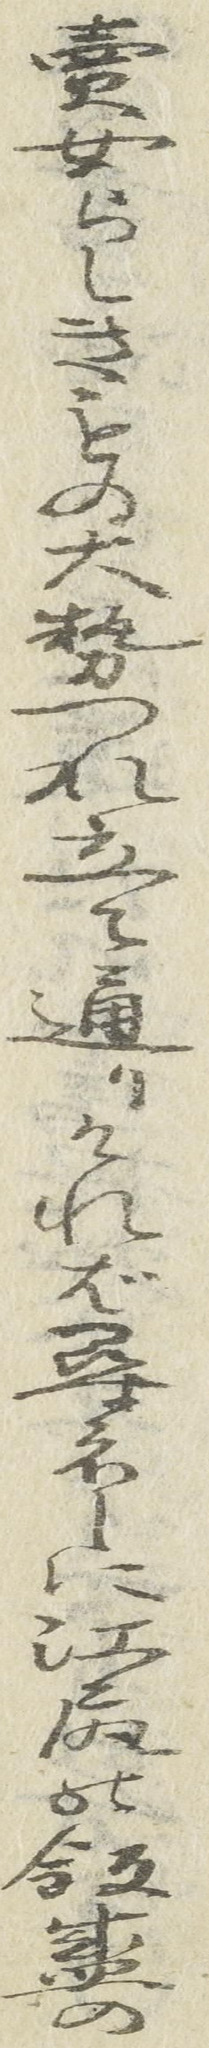売女らしきもの大勢つれ立て通りければ尋ねしに江尻の飯盛の
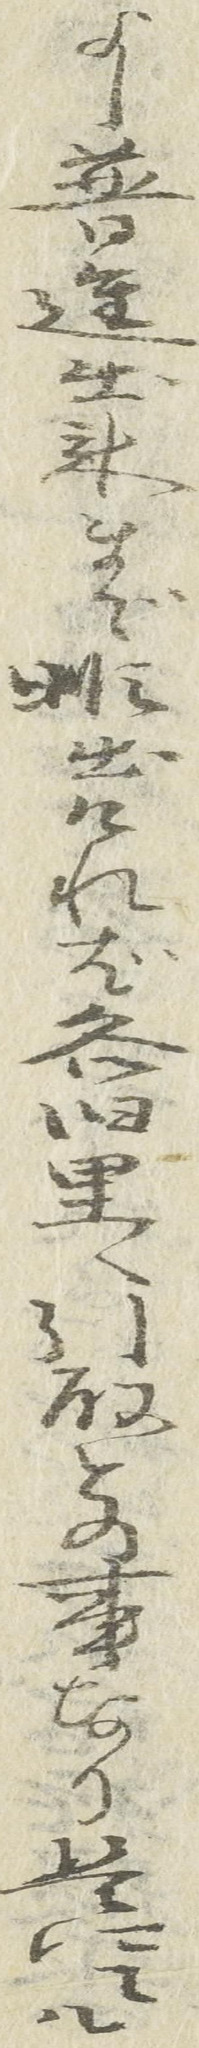よし普進出来まで暇出ければ各旧里へ引取との事なり是にても
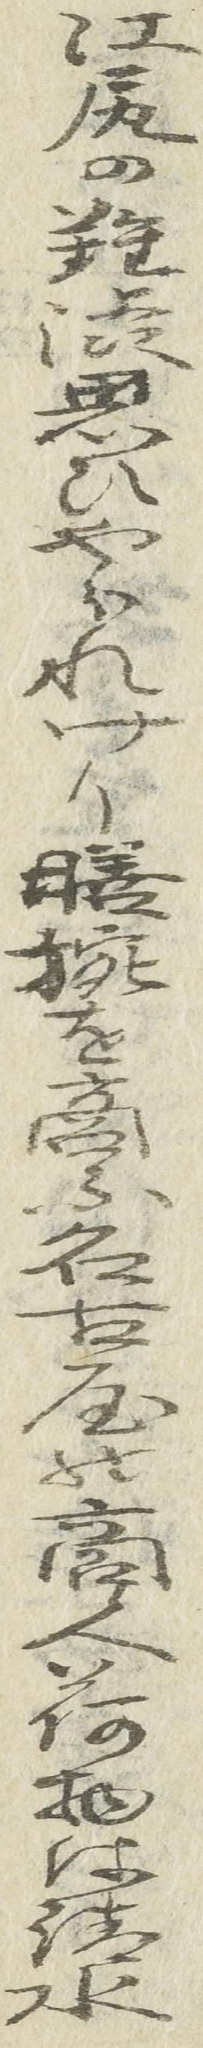江尻の難渋思ひやられけり膳椀を商ふ名古屋の商人荷物は清水
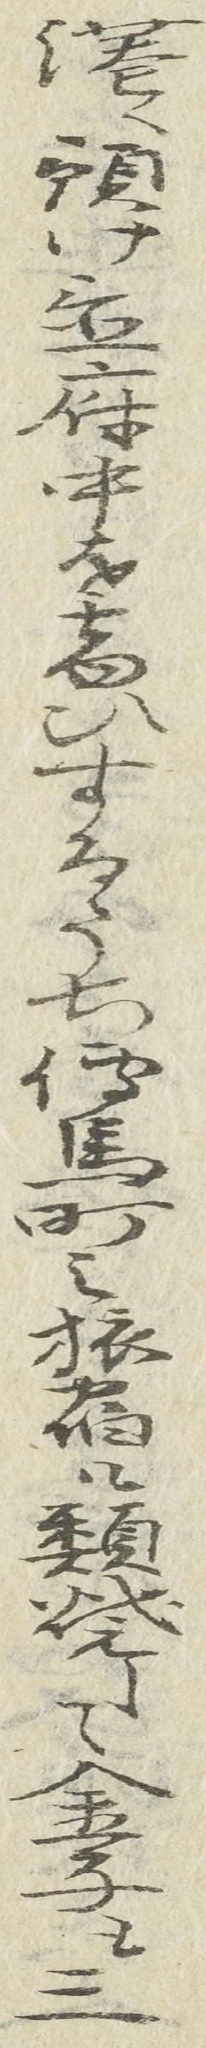港へ預け置府中を商ひするうち伝馬町之旅宿も類焼して金子も三
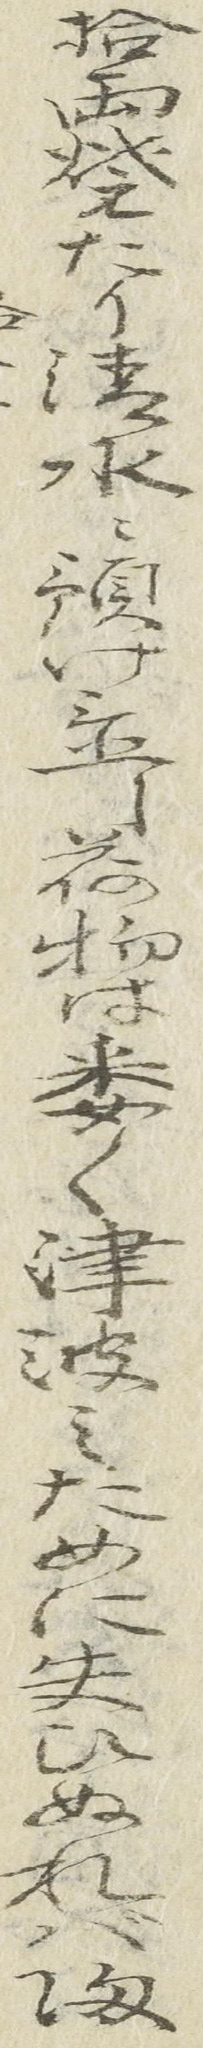拾両焼たり清水に預け置し荷物は悉く津波之ために失ひぬれば帰
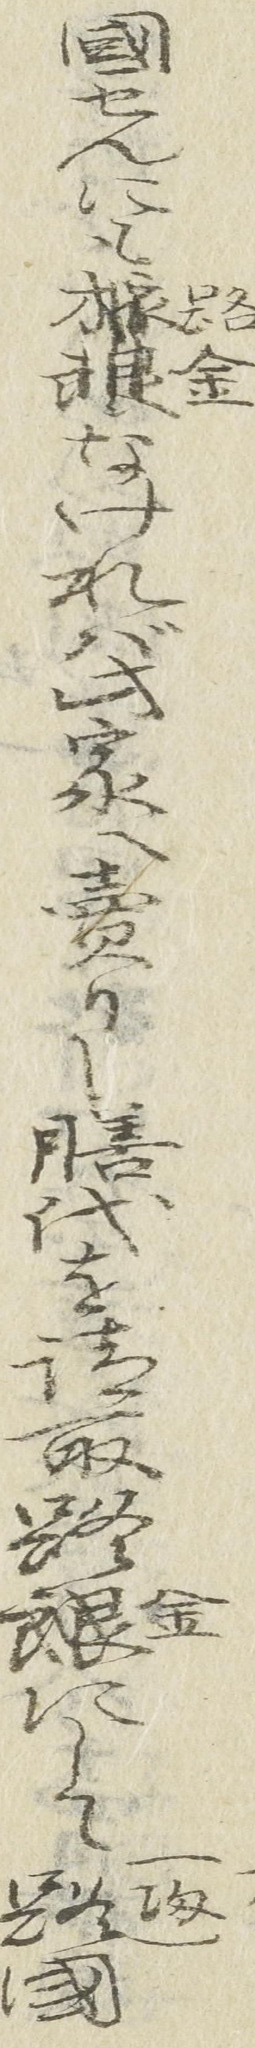国せんにも路金なければ此家へ売りし膳代を請取路銀にして路国
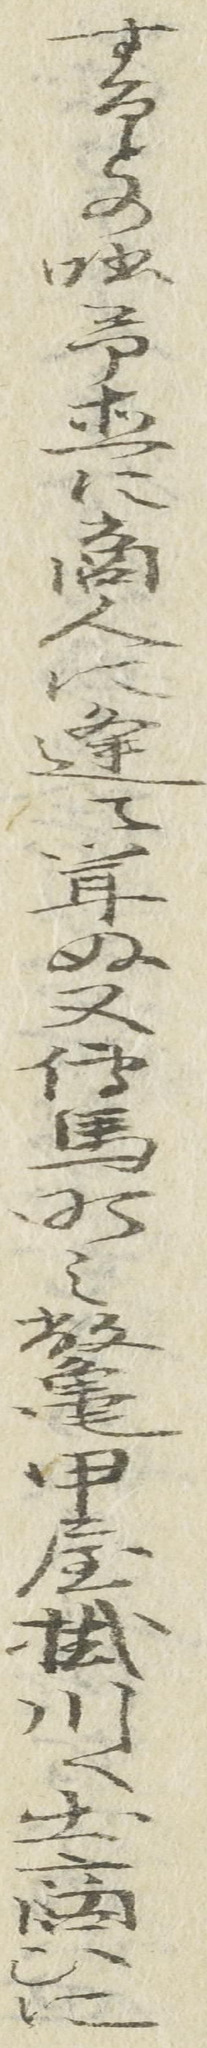するとの咄予直に商人に逢て聞ぬ又伝馬町之鼈甲屋掛川へ出商ひに
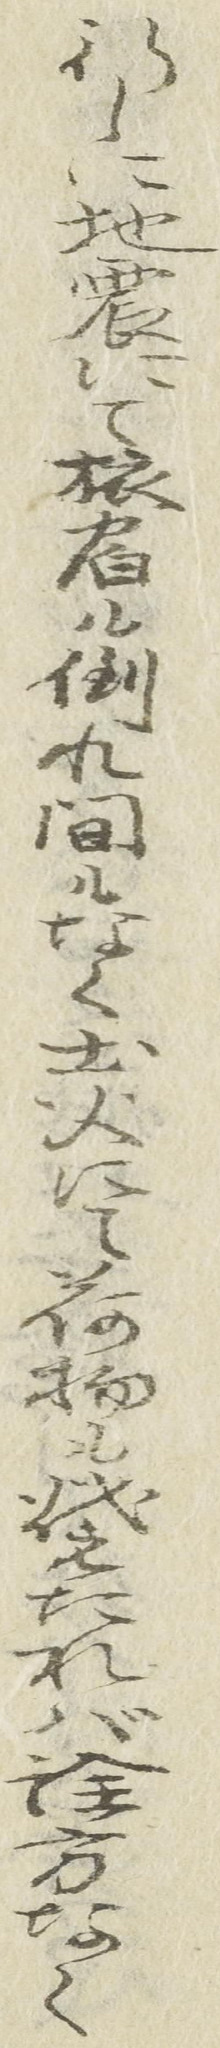行しに地震にて旅宿も倒れ間もなく出火にて荷物も焼たれば詮方なく
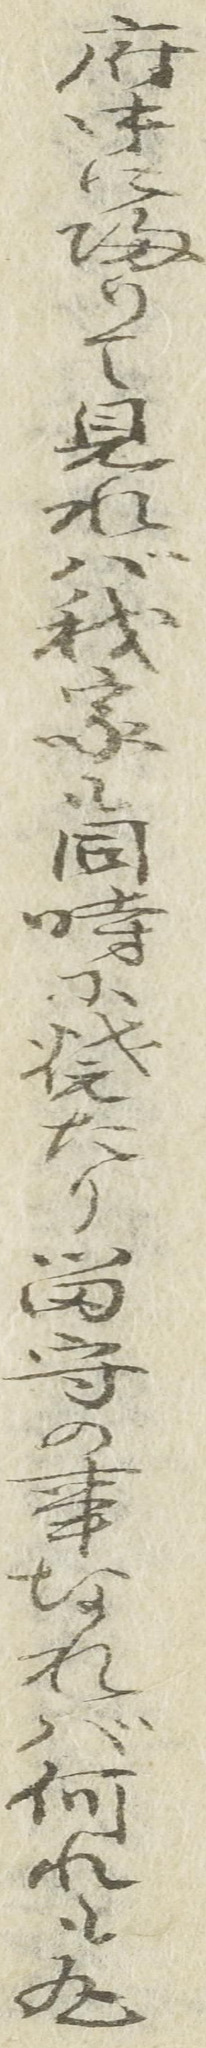府中に帰りて見れば我家も同時に焼たり留守の事なれば何れも丸
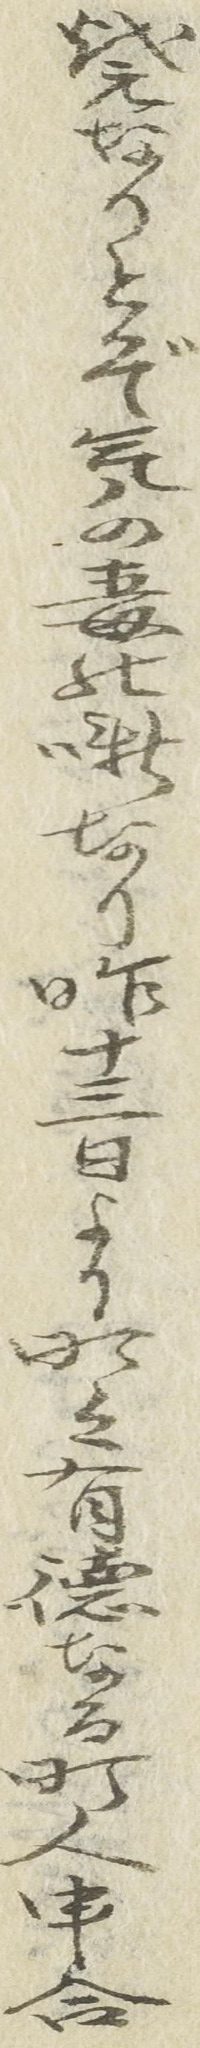焼なりとぞ気の毒の噺なり昨十三日より町々有徳なる町人申合
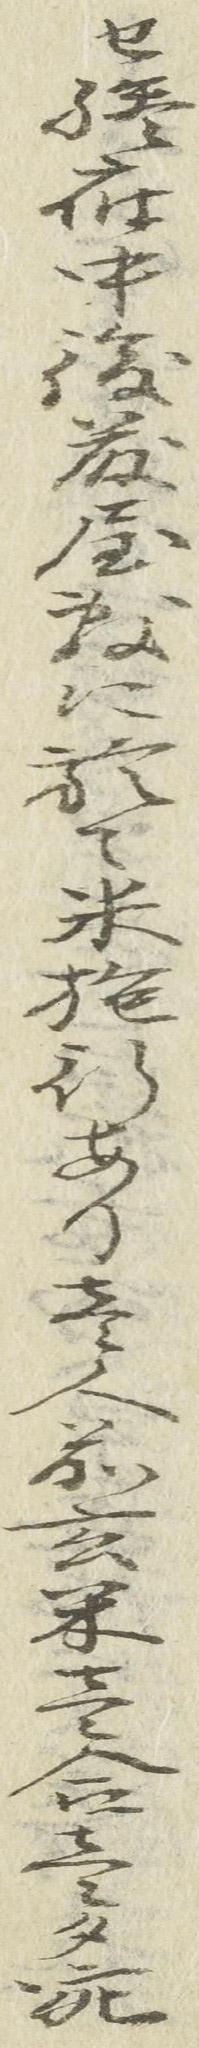せ驂府中後藤屋敷に於て米施行あり壱人前玄米壱合壱勺宛
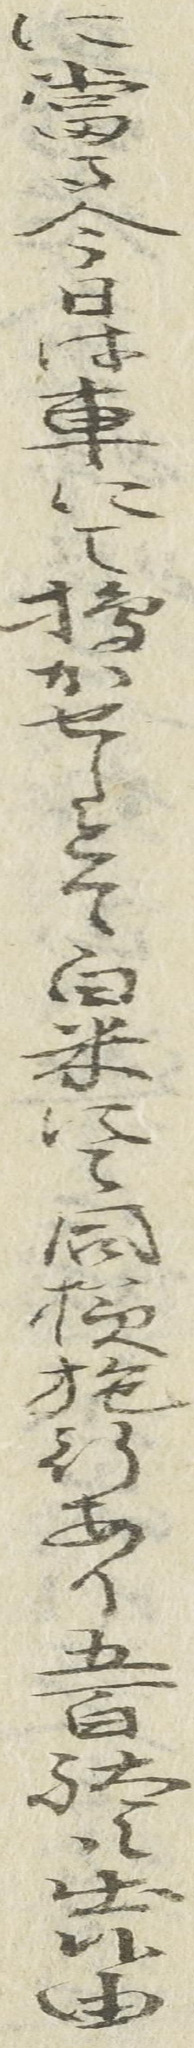に当る今日は車にて搗かせしとて白米にて同様施行あり五百駄も出候由
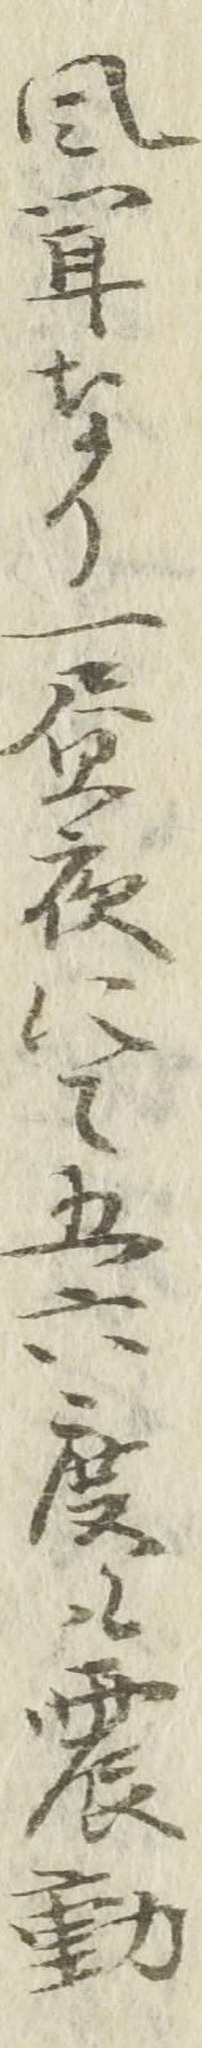風聞なり一昼夜にて五六度も震動
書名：地震前兆集　全
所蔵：東京大学地震研究所図書室 Earthquake Research Institute Library, The University of Tokyo, JAPAN
